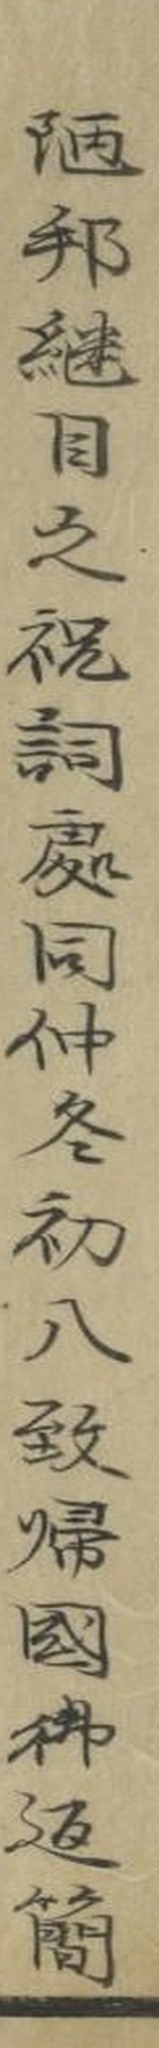陋邦継目之祝詞處同仲冬初八致帰国御返簡
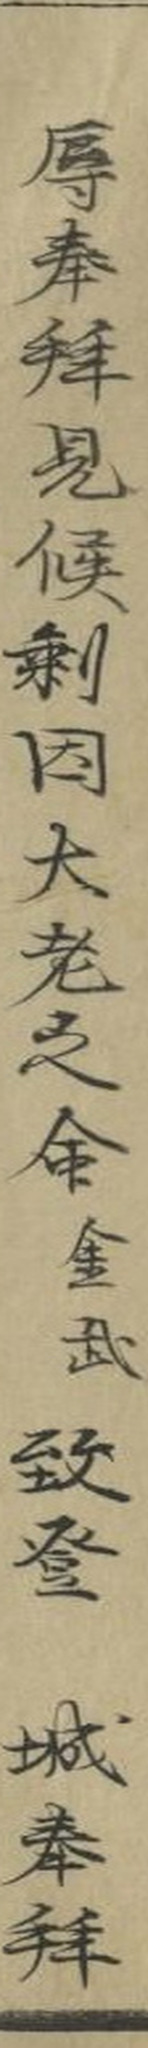辱奉拝見候剰因大老之命金武致登城奉拝
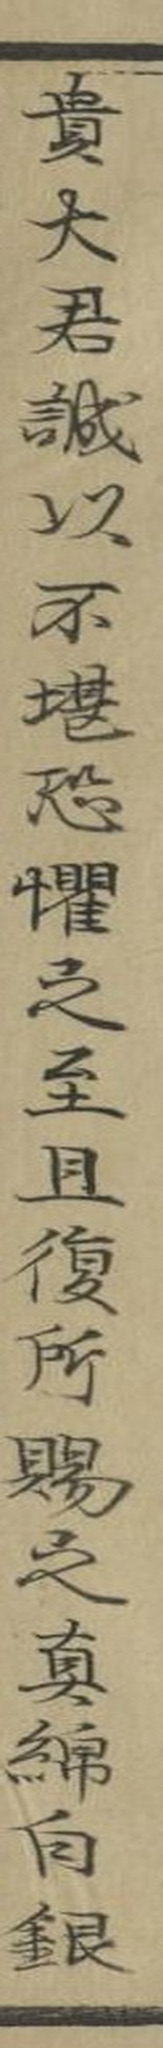貴大君誠以不堪恐懼之至且復所賜之真綿白銀

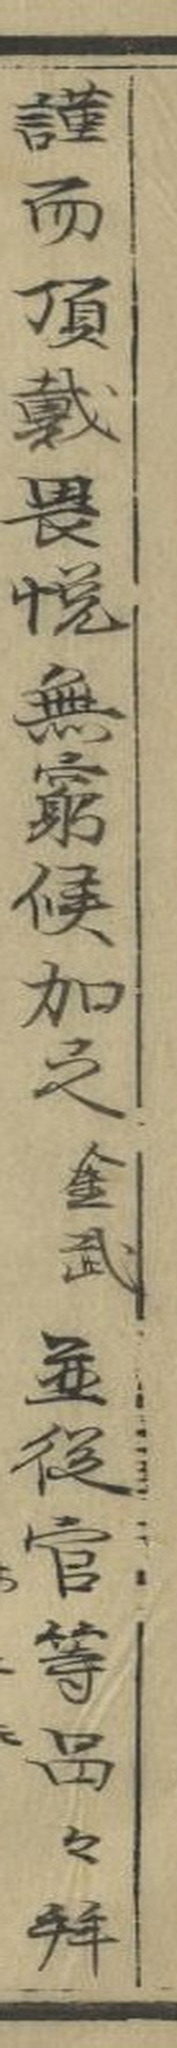謹而頂戴畏悦無窮候加之金武並従官等品々拝
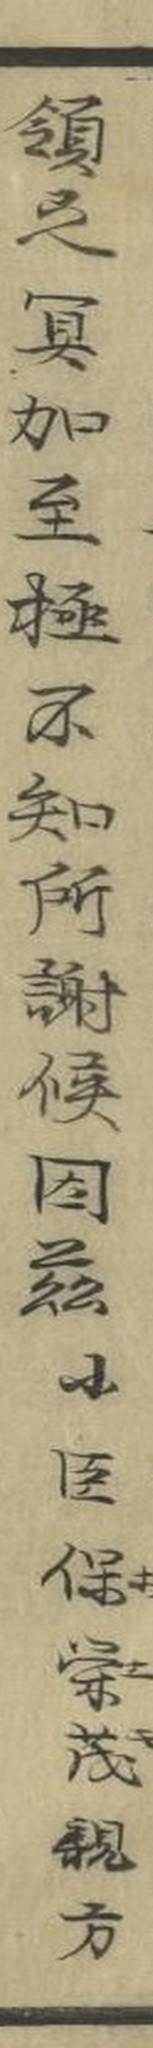領之冥加至極不知所謝候因茲小臣保栄茂親方
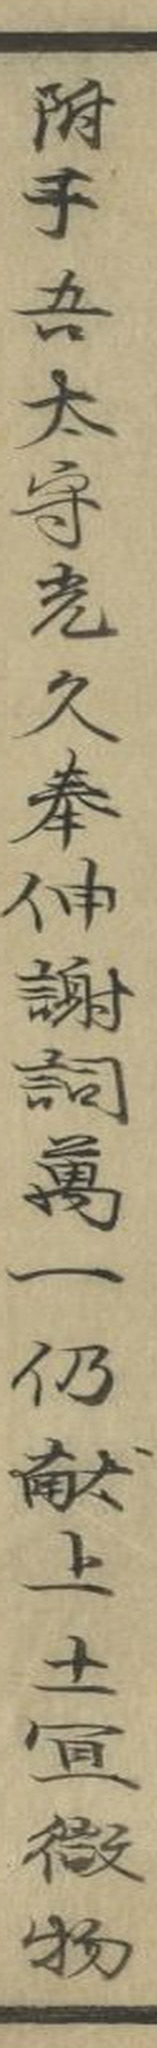附于吾太守充久奉伸謝詞萬一仍献上土冝微物
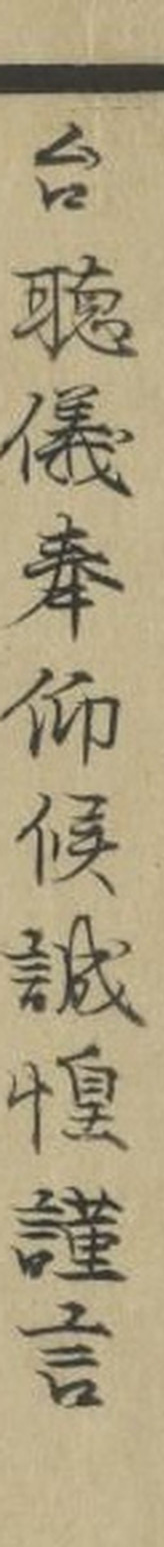台聴儀奉抑候誠惶謹言
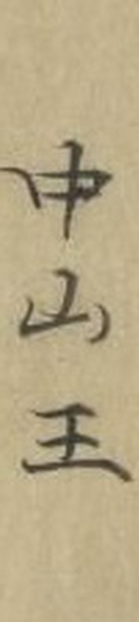中山王
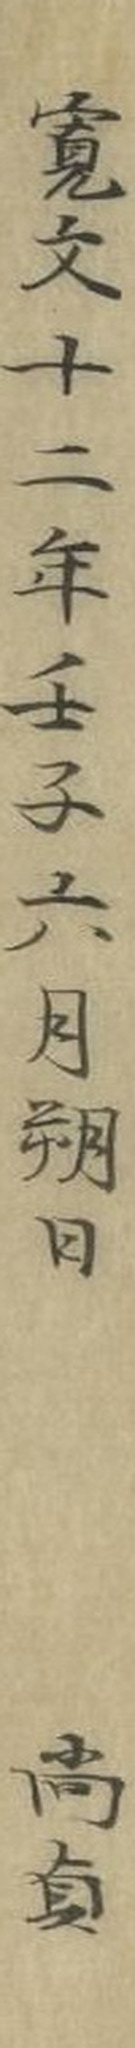寛文十二年壬子六月朔日尚貞
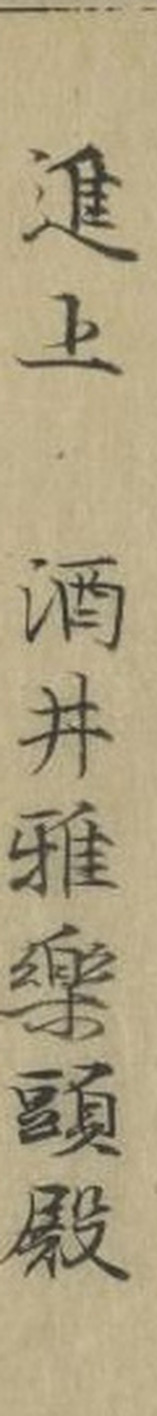進上酒井雅楽頭殿
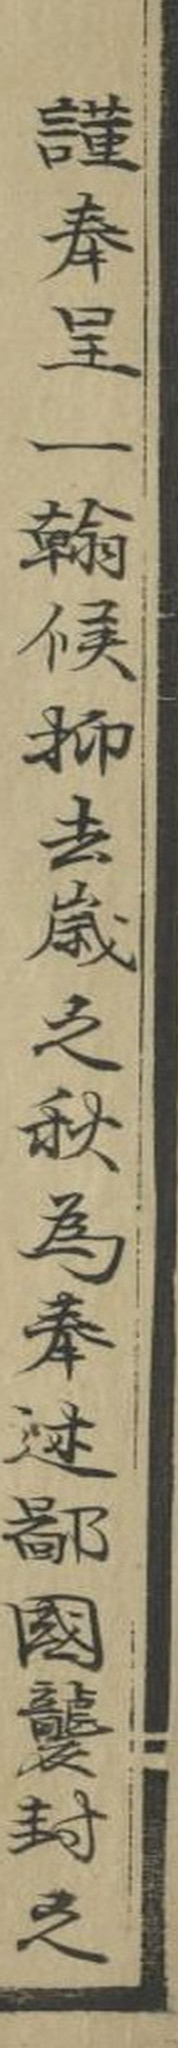謹奉呈一翰候抑去歳之秋為奉述鄙国襲封之
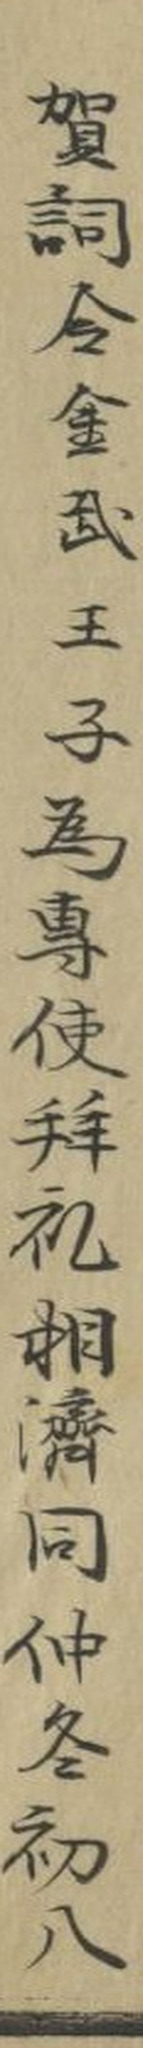賀詞令金武王子為専使拝礼相済同仲冬初八
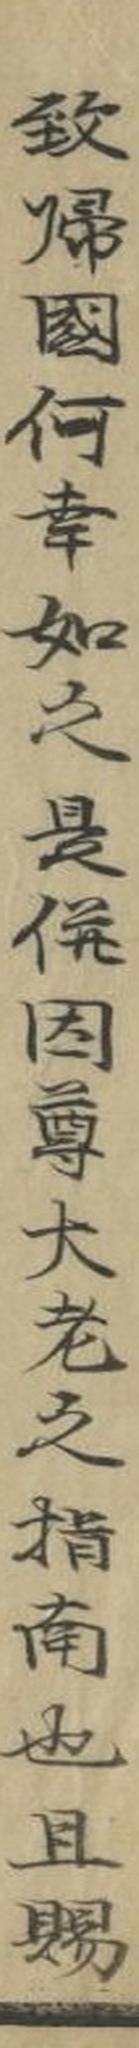致帰国何幸如之是併因尊大老之指南也且賜
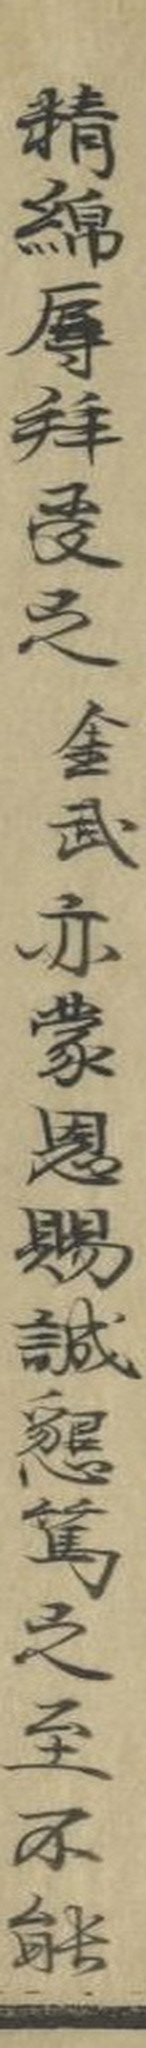精綿辱拝受之金武亦蒙恩賜誠懇篤之至不能
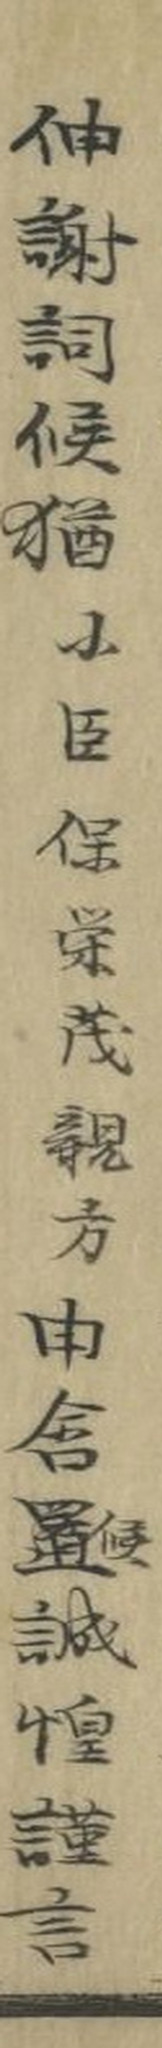伸謝詞候猶小臣保栄茂親方申誠惶謹言
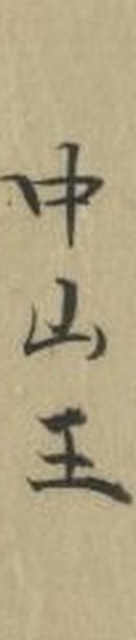中山王
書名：琉球往来（下）
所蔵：University of the Ryukyus Library
